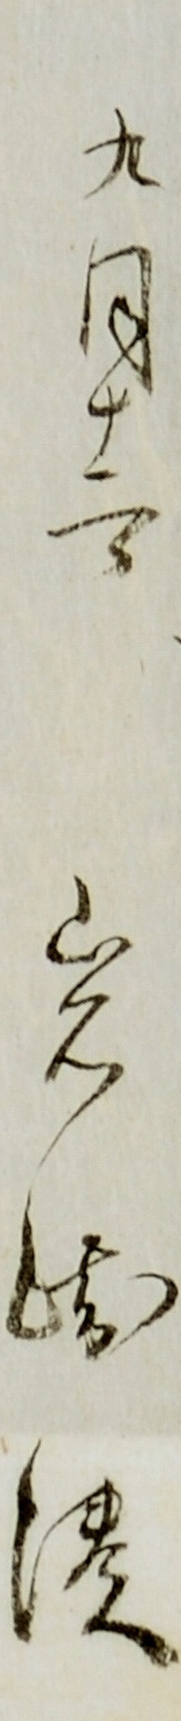九月十二日岩崎湊
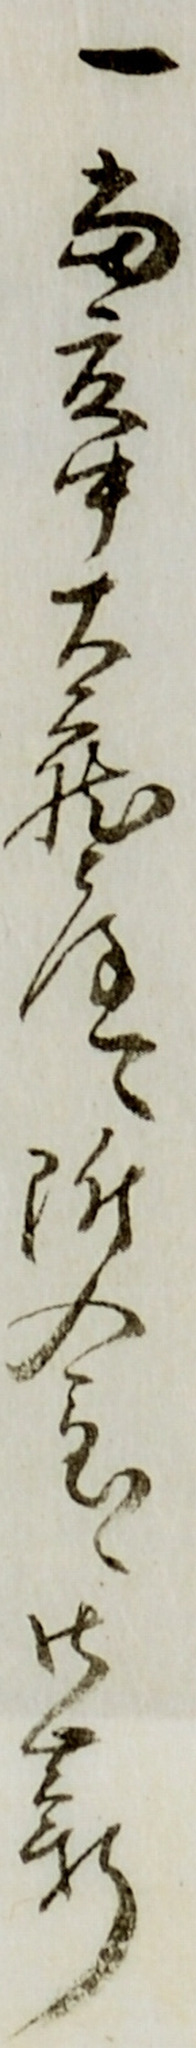一当夏中大蔵庭へ附入置候御薪
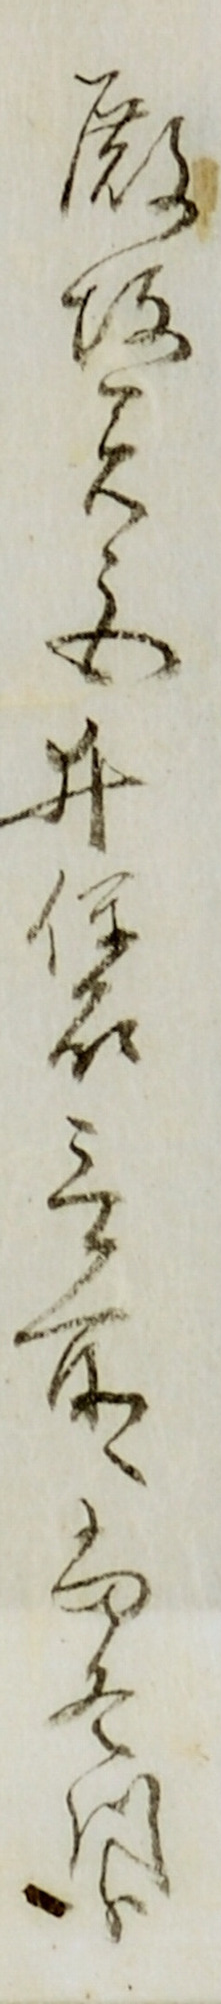殿坂若宮井保石三ヶ所へ当冬川分
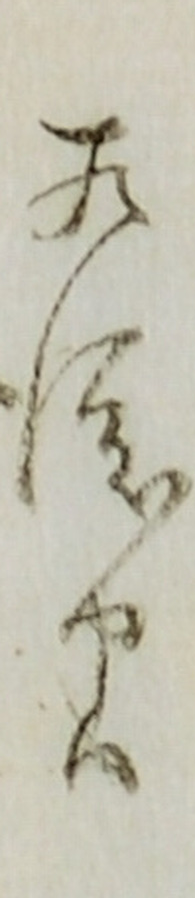相渡申候
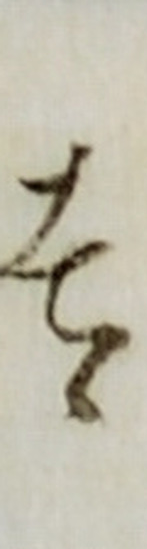十七日
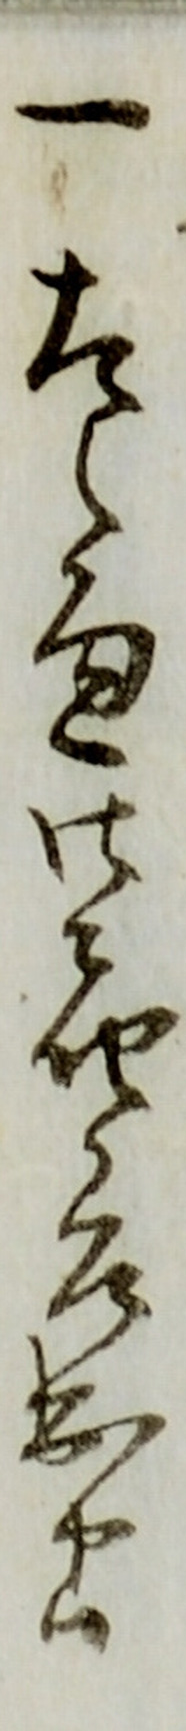一左之通御届差出申候
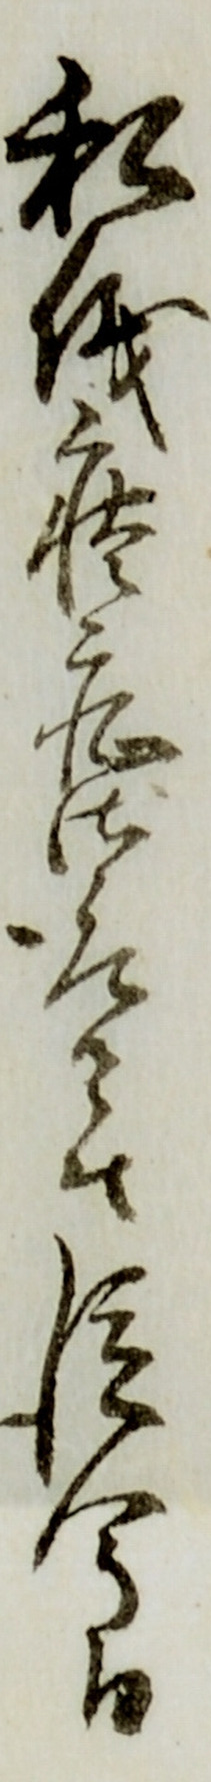私儀痰症御座候に付従今日
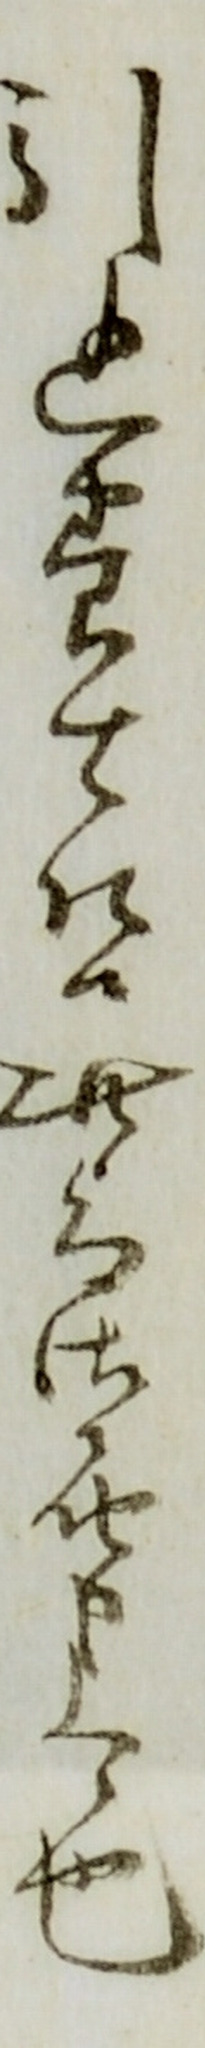引込養生仕候此旨御届申上候也
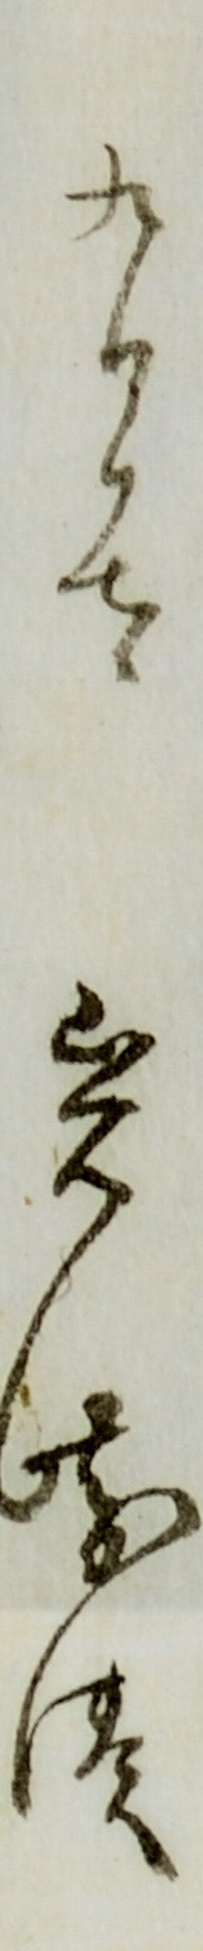九月十七日岩崎湊
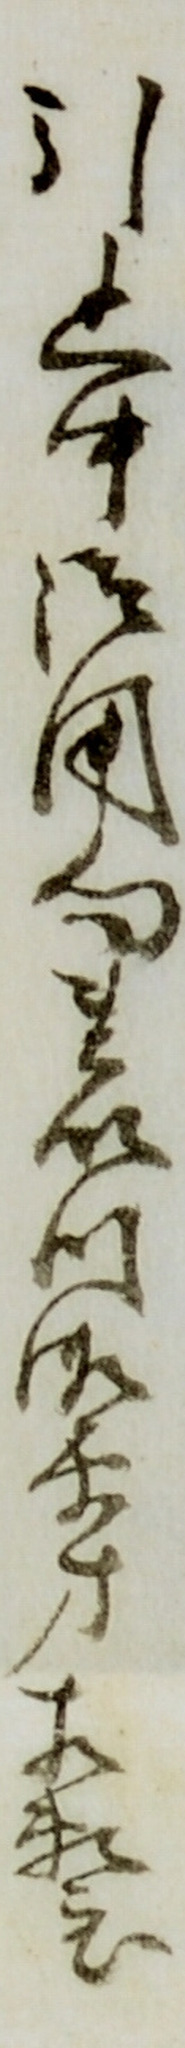引込中御用向共以川瀬平方相頼置
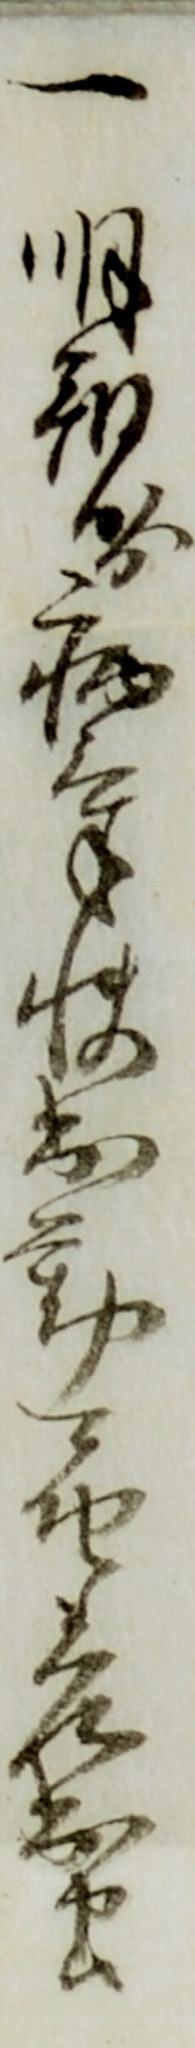一明朔日ゟ病気快出勤届差出申候

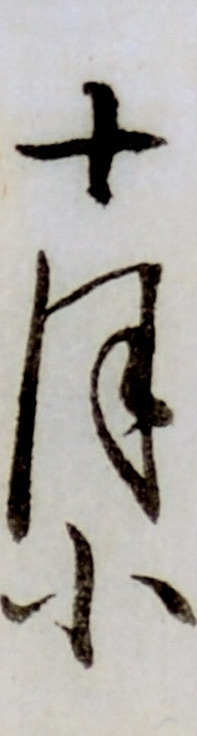十月小
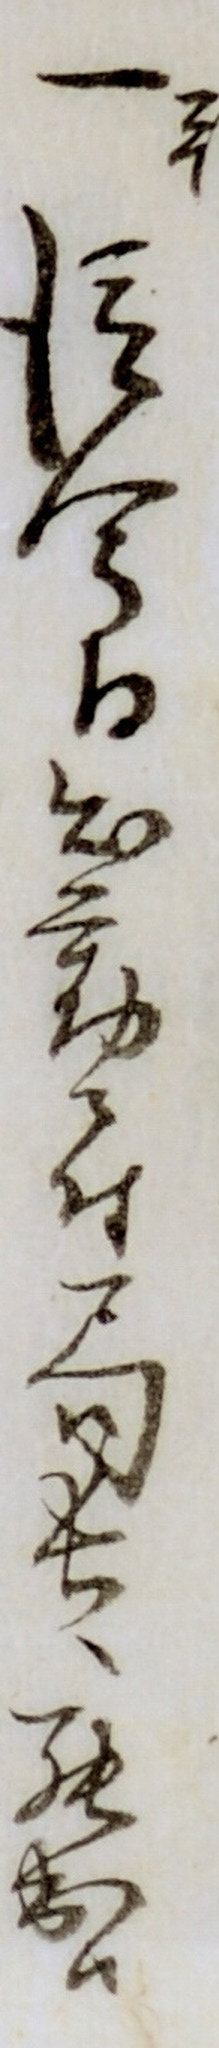一従今日出勤に付局長へ罷出候
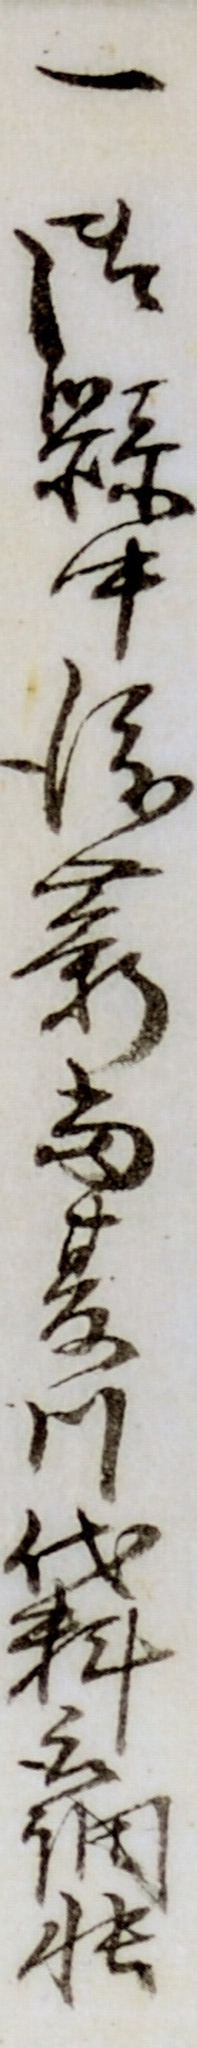一御県中渡薪当夏川伐料取調帳
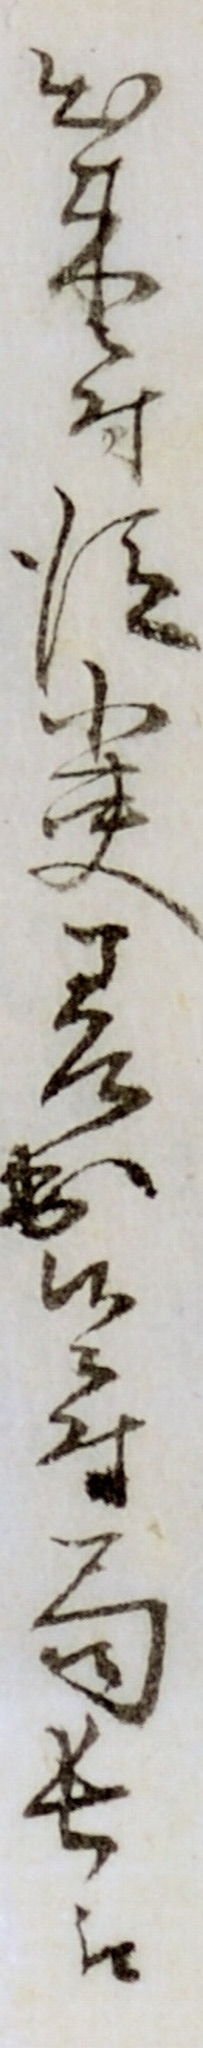出来に付従小吏差出候に付局長え
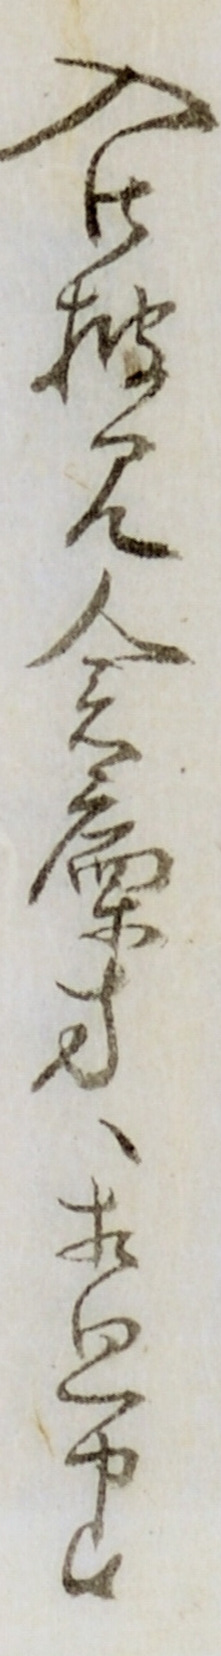入御披見倉廩方へ相廻申候
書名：山林方諸事御用留
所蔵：伊那市立高遠町図書館・合同会社AMANE
